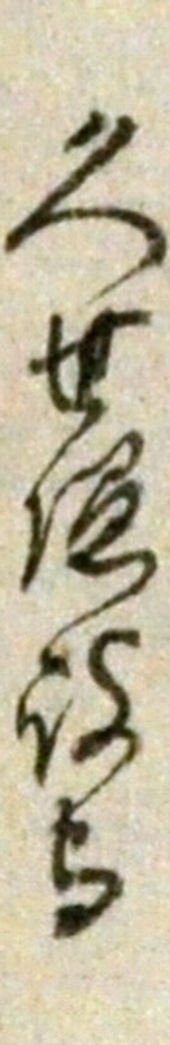久世隠岐守
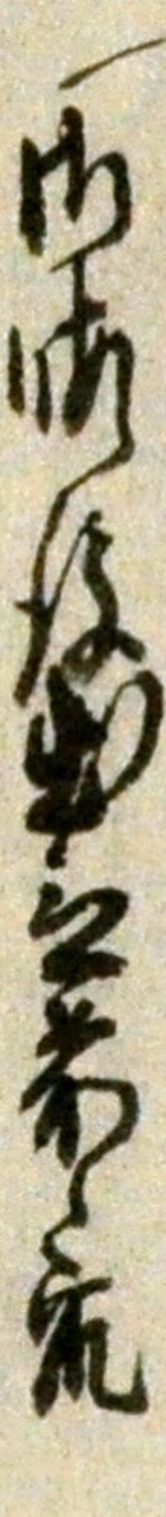御暇後出立前之衆
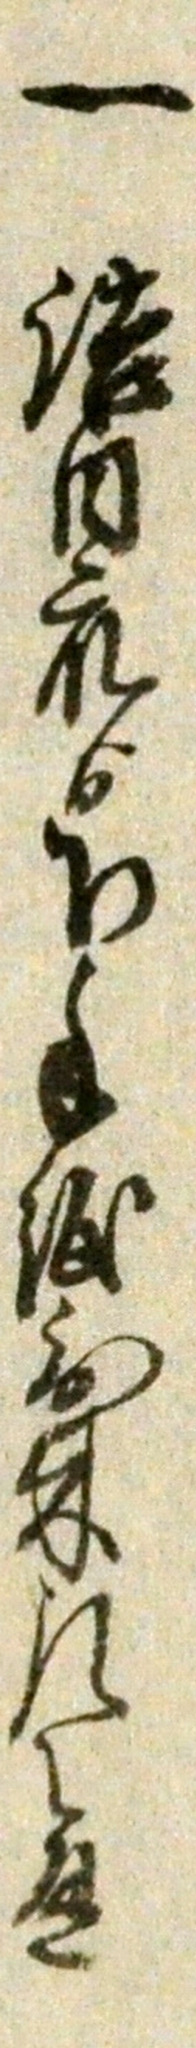一詰日衆ゟ下手紙到来左之通
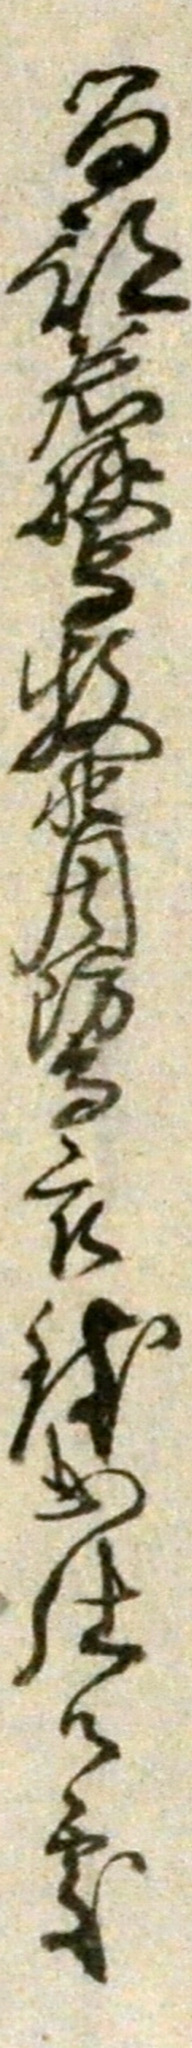間部若狭守牧野周防守被致出仕候處
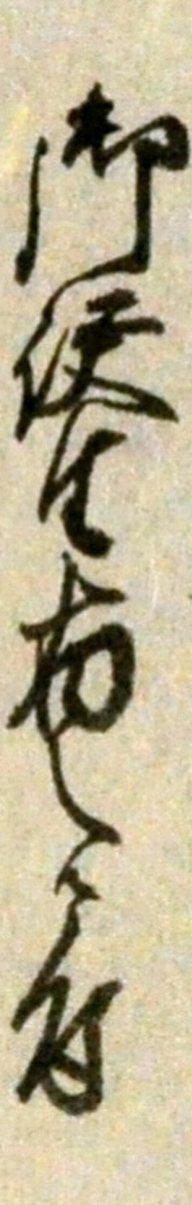御誕生右有之候付
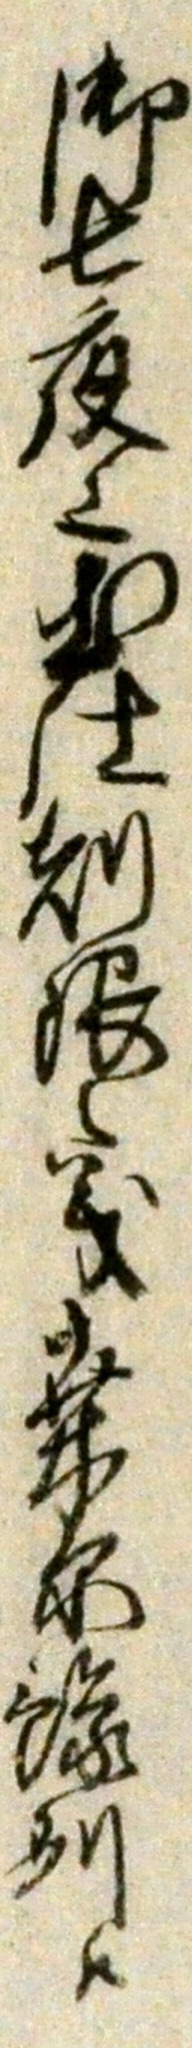御七夜迄出仕刻限之義桑原豫州え
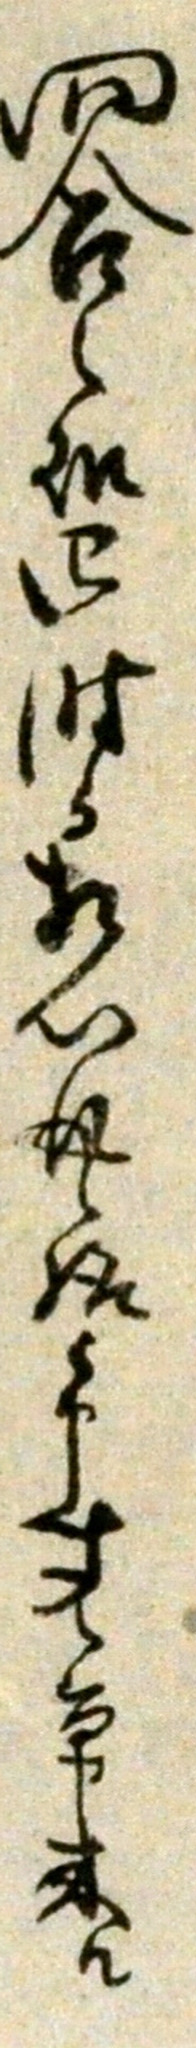問合候処四時と相心得候様被申聞候而旨申来候ル
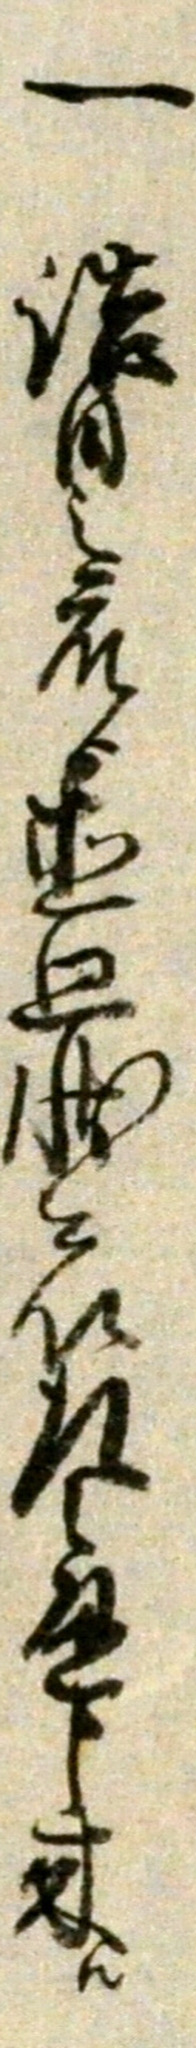一詰日之衆ゟ直廻状を以左之通申来候ル
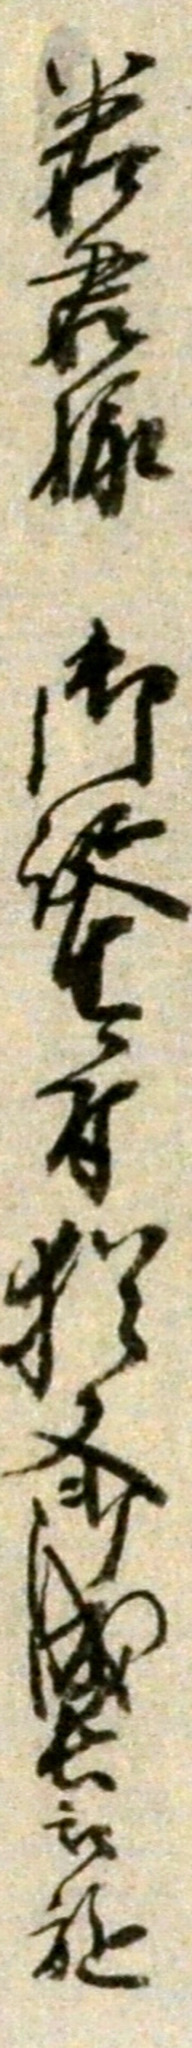若君様御誕生ニ付猶又御成長被遊
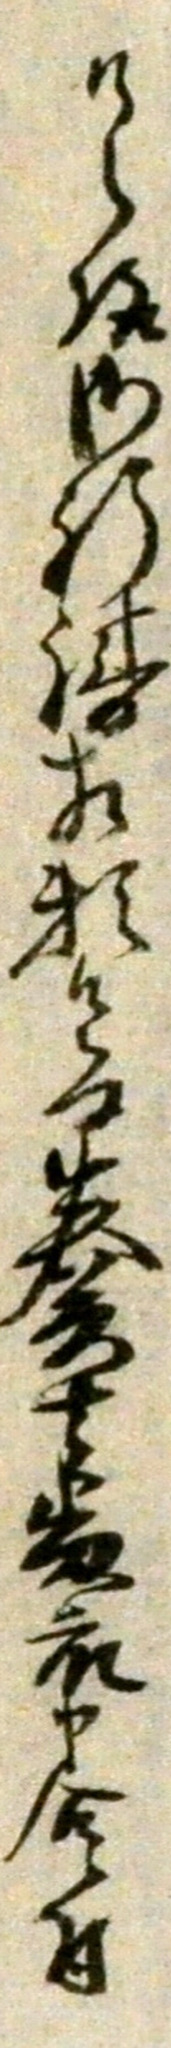候之様御祈祷相頼候ニ而奏者番衆申合ニ付
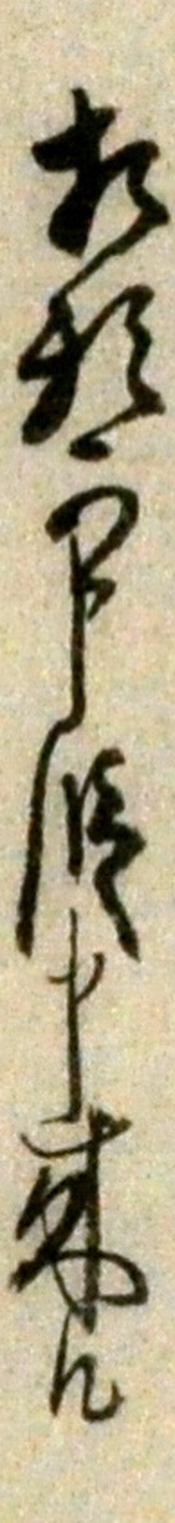相頼可申段申来候ル
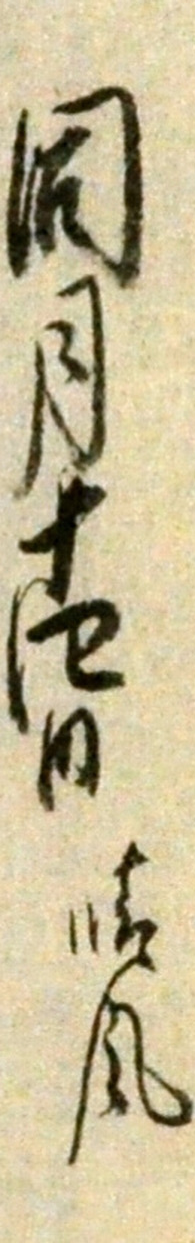同月十四日晴風
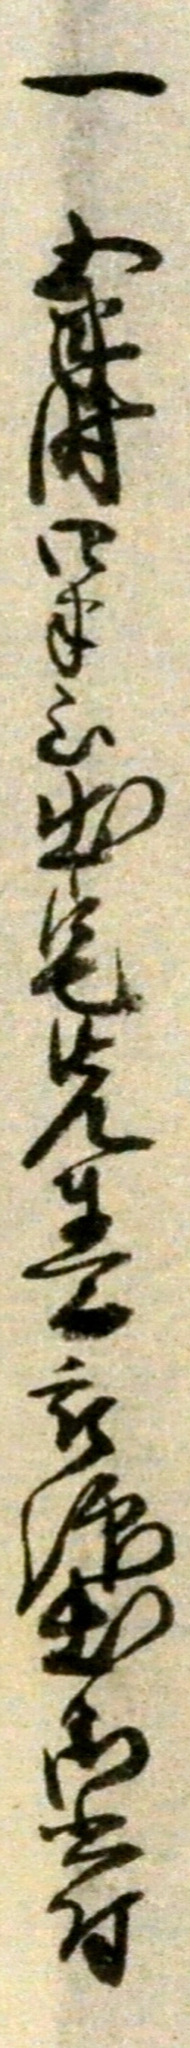一五半時四半至出宅先達而被仰出候御書付
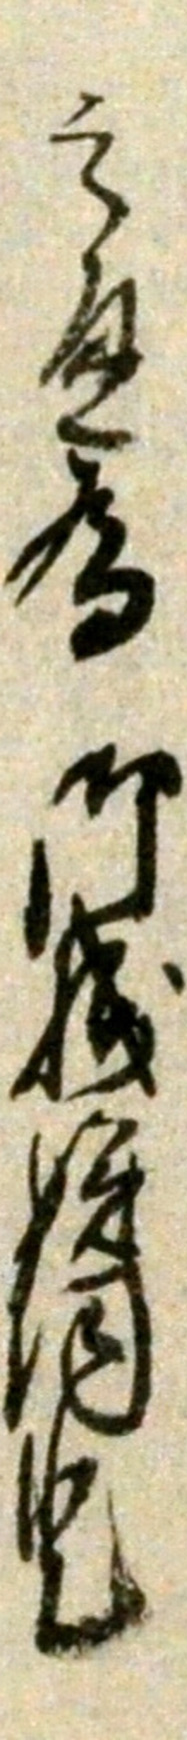之通為御機嫌伺登
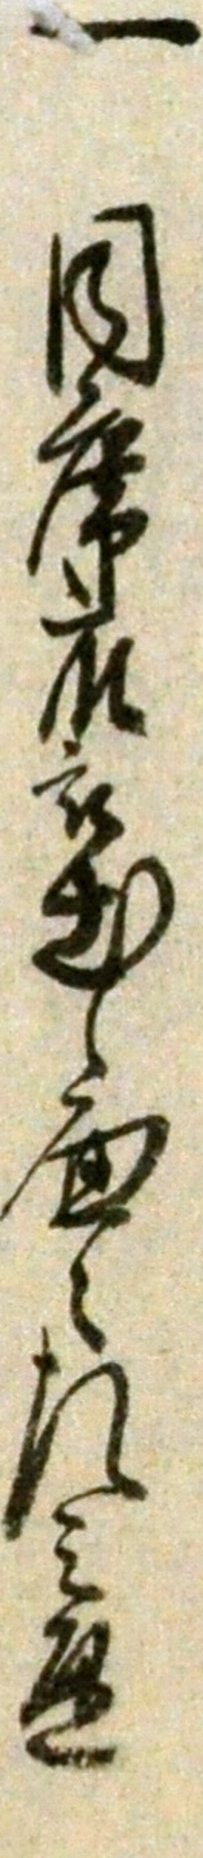一同席衆被出候面々左之通
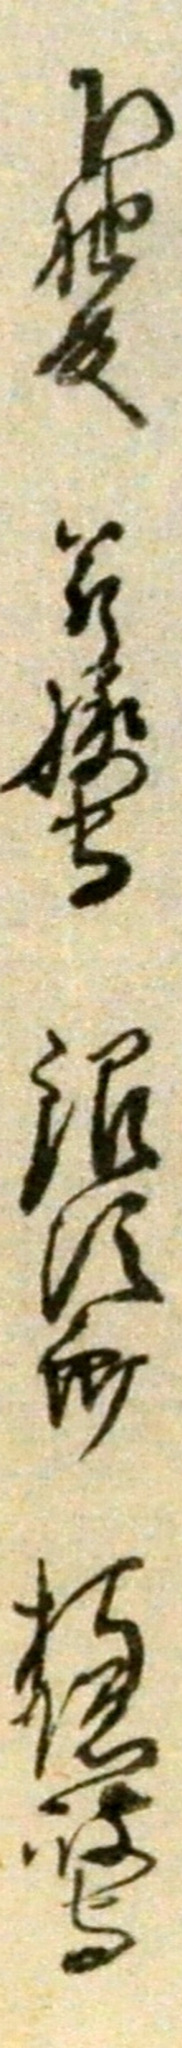下野殿若狭守銀次郎朽隠岐守
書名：若君様（家斉嫡男）誕生諸祝儀ノ節ノ留書外
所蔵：伊那市立高遠町図書館・合同会社AMANE
